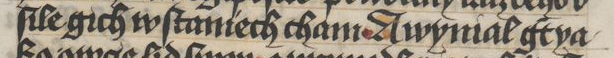ſile gich wſtaniech cham.A wynial ḡt ya¬
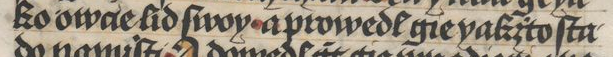ko owcie lid ſwoy.a prowedl gie yakżto ſta¬
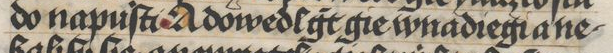do napuẛti.A dowedl ḡt gie wnadiegi a ne¬
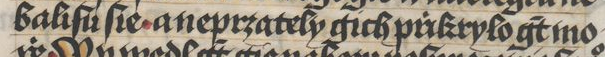baliſu ſie.a neprzately gich pṙikrylo ḡt mo¬
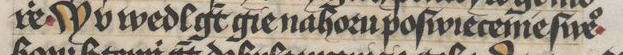ṙe.A v wedl ḡt gie nahoru poſwiecenie ſweo.
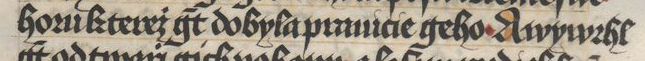horu ktreż ḡt dobyla prauicie geho.A wywrhl
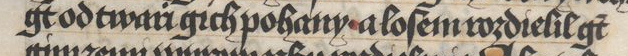ḡt od twaṙi gich pohany.a loſem rozdielil ḡt
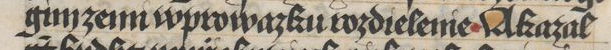gim zemi wprowazku rozdielenie.Akazal
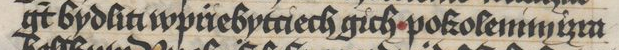ḡt bydliti wpṙiebytciech gich.pokolenim izra¬
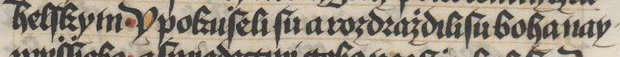helſkym.Ypokuẛeli ſu a rozdrażdiliſu boha nay¬
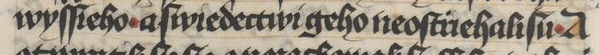wyẛẛieho.a ſwiedectwi geho neoſtṙiehaliſu.A
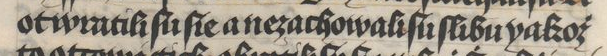otwratili ſu ſie a nezachowali ſu ſlibu yakož
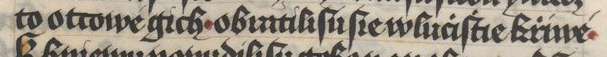to otcowe gich.obratili ſu ſie wluċiẛtie kṙiwé.
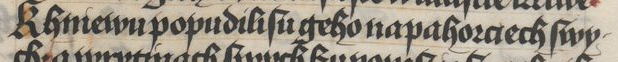K hniewu popudili ſu geho napahorciech ſwy¬
